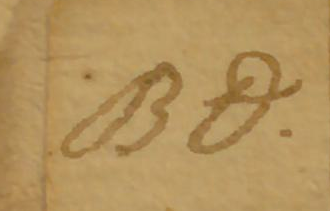BO.
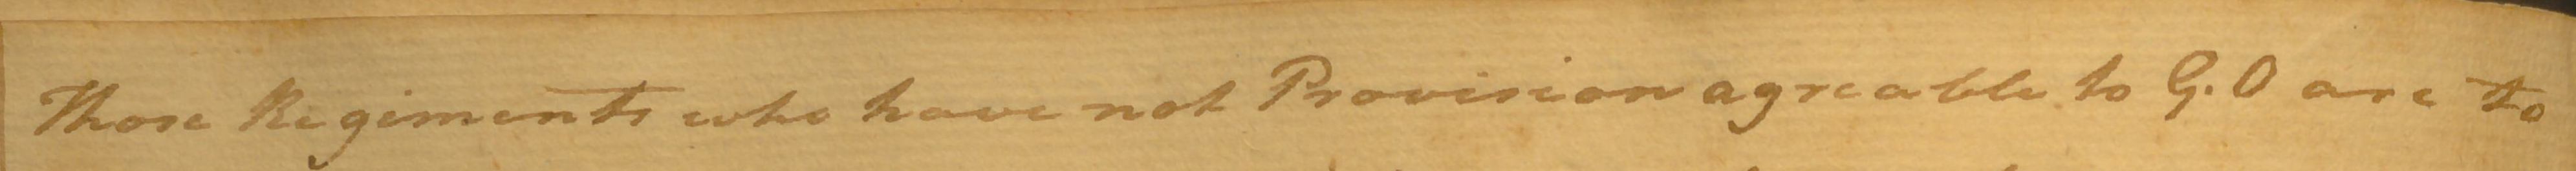Those Regiments who have not Provision agreable to G.O are to
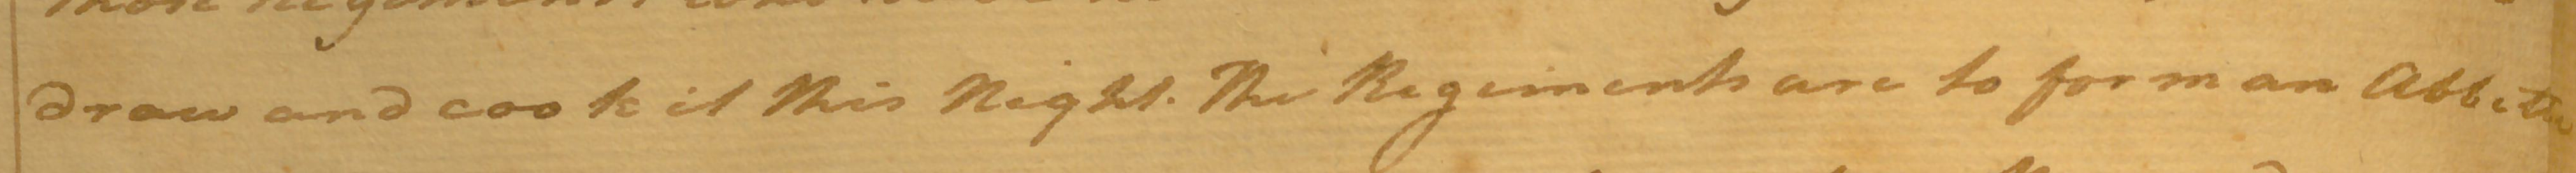draw and cook it this Night. The Regiments are to form an Abbette
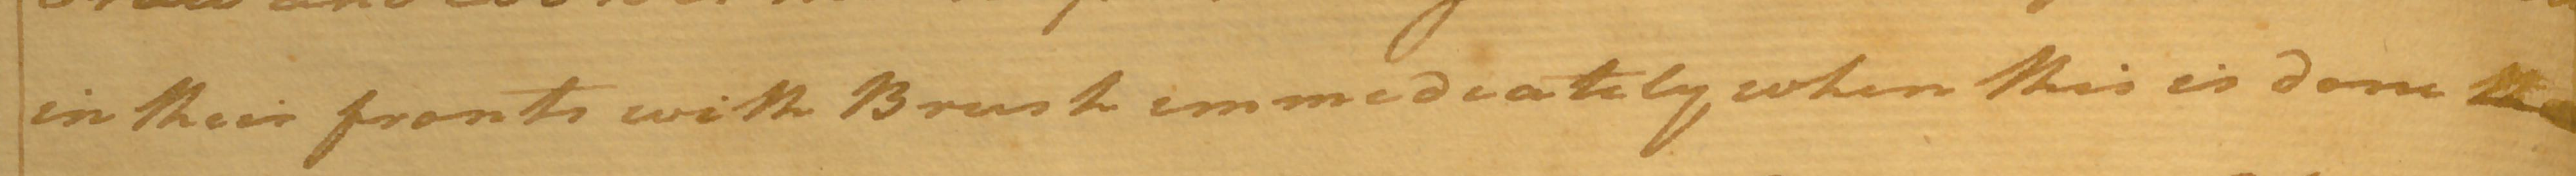in their fronts with Brush immediately when this is done
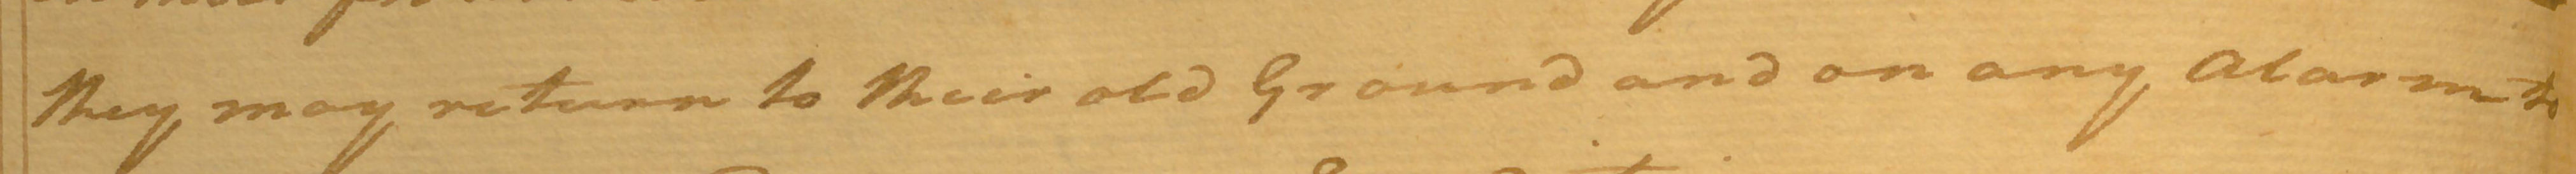they may return to their old Ground and on any Alarm to
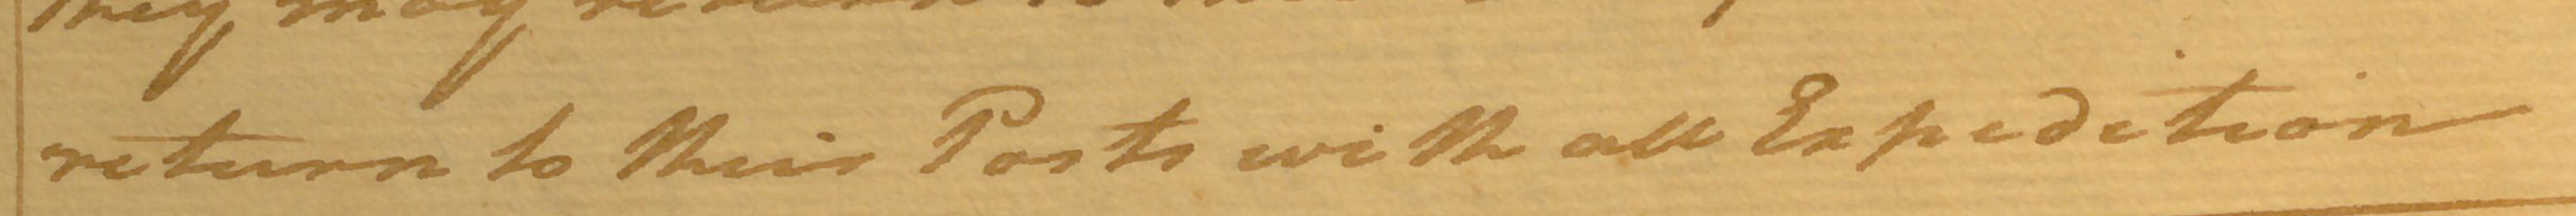return to their Posts with all Expedition
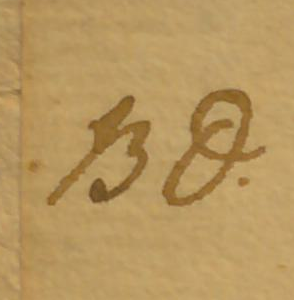BO.
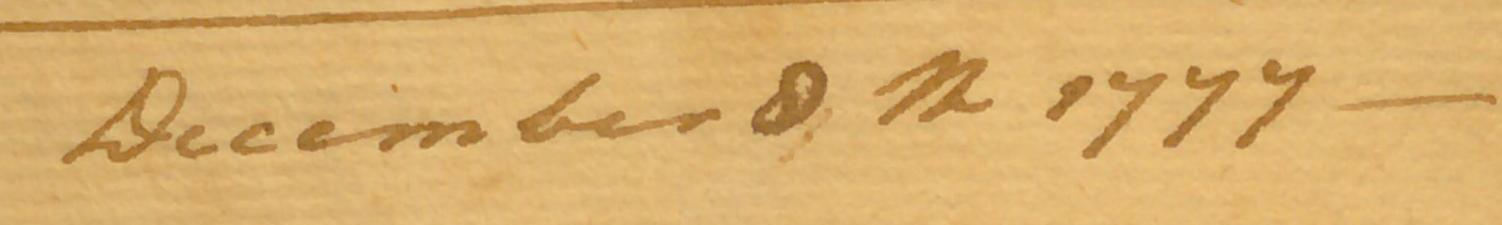December 8^th 1777-
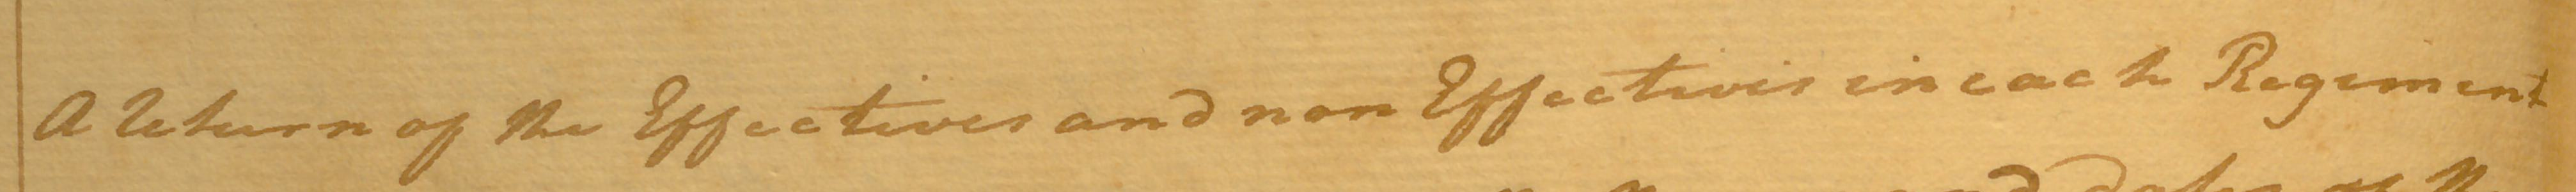A return of the Effectives and non Effectives in each Regiment
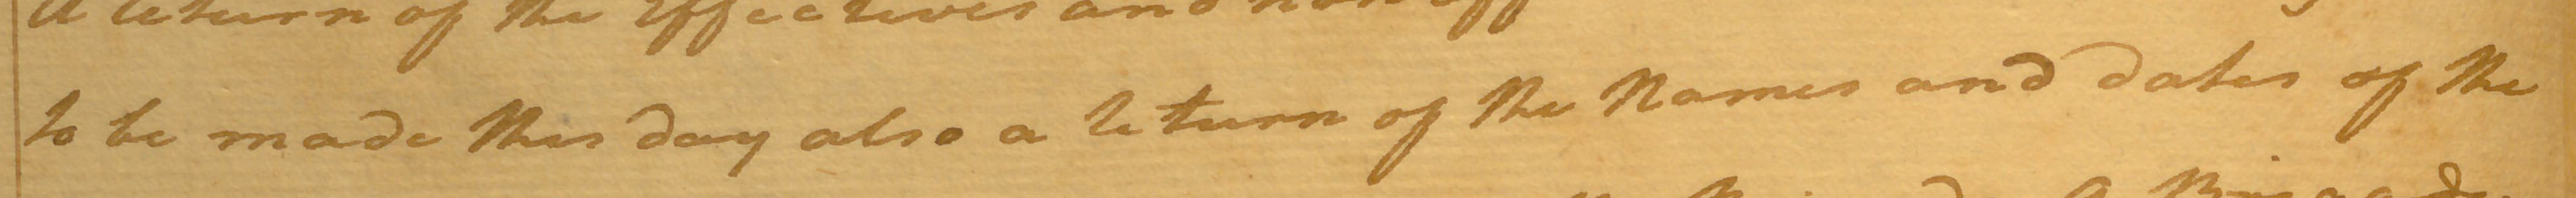to be made this day also a return of the Names and dates of the
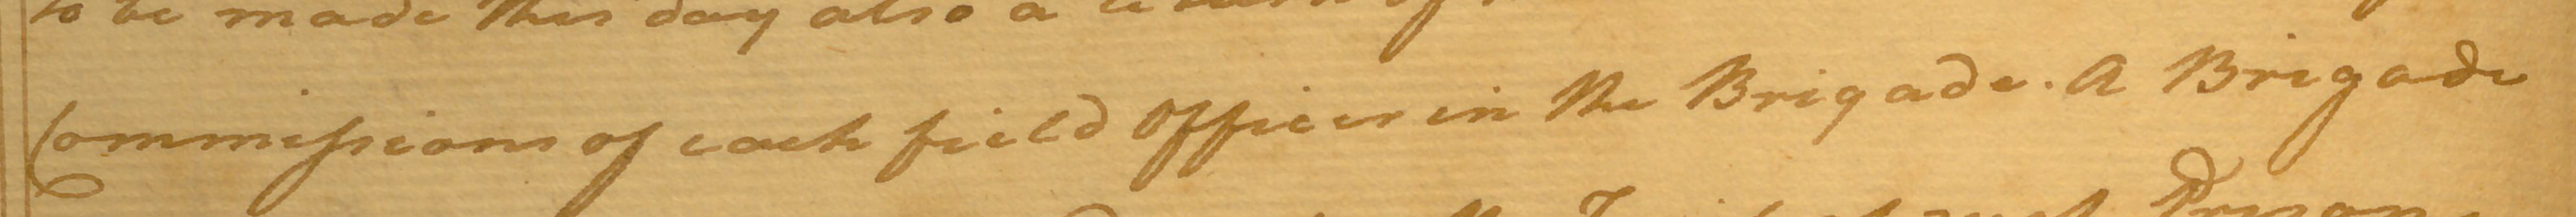Commissions of each field officer in the Brigade. A Brigade
